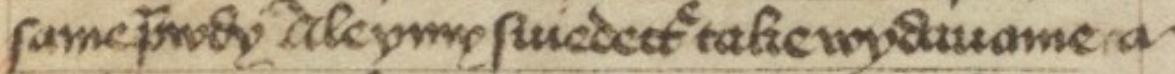ſame p̃wdy Ale ymy ſuiedecte take wydauame a
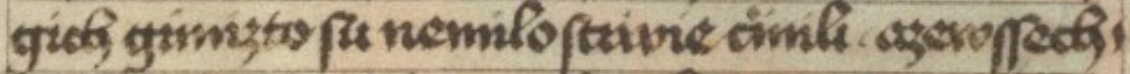gich gimizto ſu nemiloſtivie ċinili azewſſech
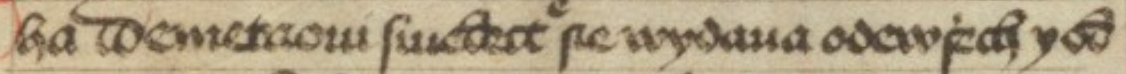ha Demetrioui ſuiedecte ſie wydaua odewẛech y od
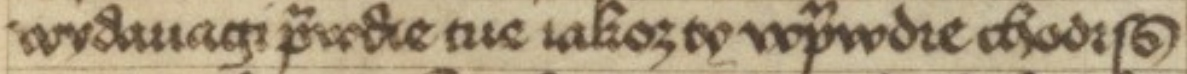wydauagi p̃wdie tue iakoz ty wp̃wdie chodiſs
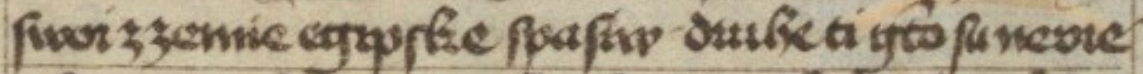ſwoi z zemie egipſke ſpaſiw druhe ti g̑to ſu nevie-
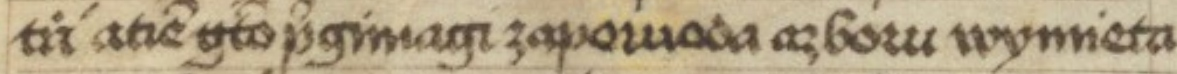tṙi atiȇ g̑to p̑gimagi zaporuoda az boru wymieta
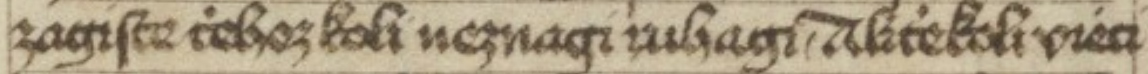zagiſte ċehoz koli neznagi ruhagi Akċekoli vieci
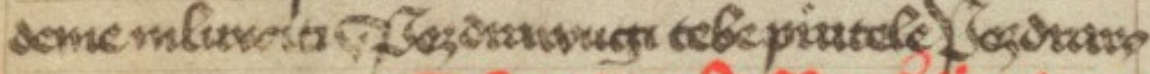deme mluviti Pozdrawugi tebe pṙatele Pozdraw
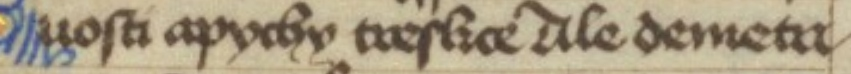uoſti apychy treſlice Ale demetri-
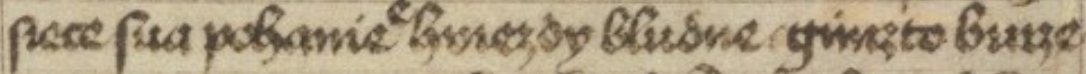ſiace ſua pohaniee hviezdy bludne gimzto burze
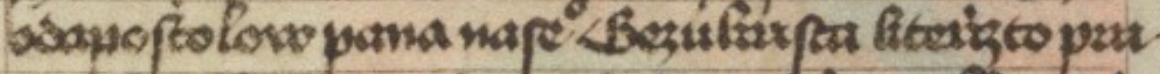odapoẛtolow pana naſe° Gezukriſta kteṙizto pra-
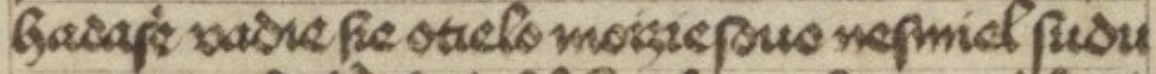hadaẛe vadie ſie otielo moizieſouo neſmiel ſudu
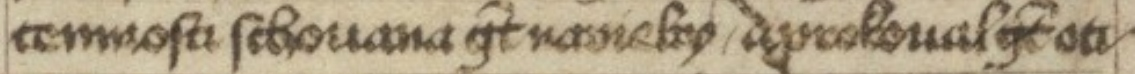temnoſti ſchouana g̑t navieky Aꝓrokoual g̑t oti-
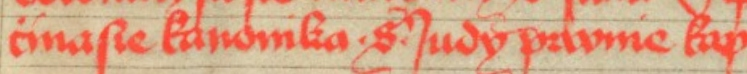ċinaſie kanonika·S·Judy prwnie kap
